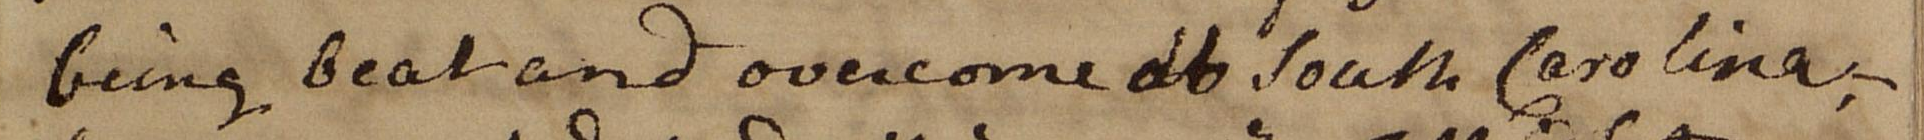being beat and overcome at South Carolina,-
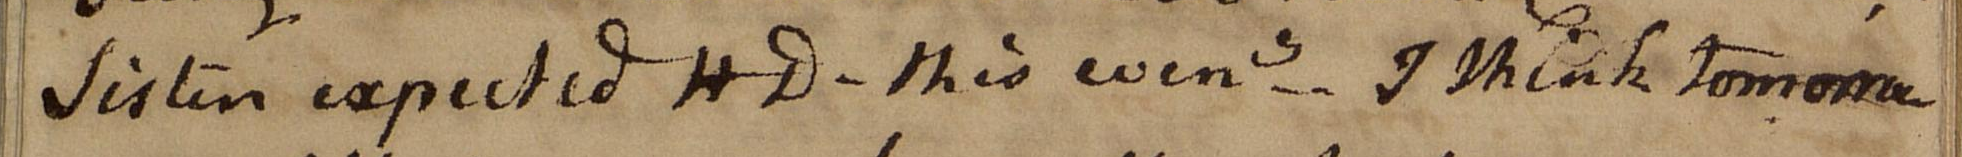Sister expected HD-this even^g- I think tomorrow
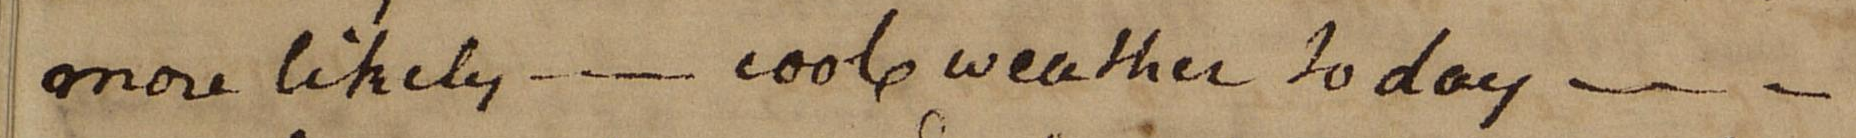more likely-- cool weather to day--
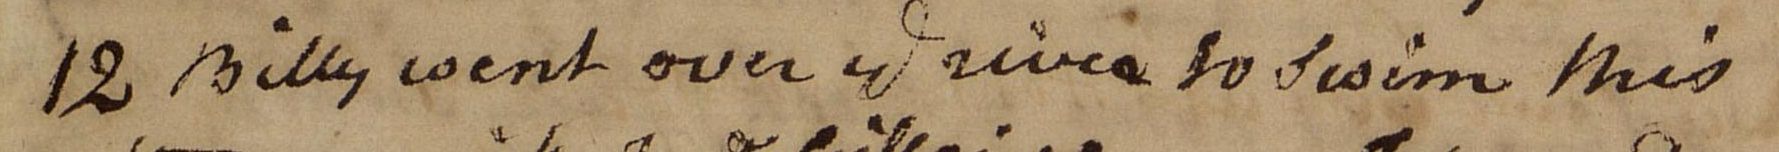12 Billy went over y^e river to swim this
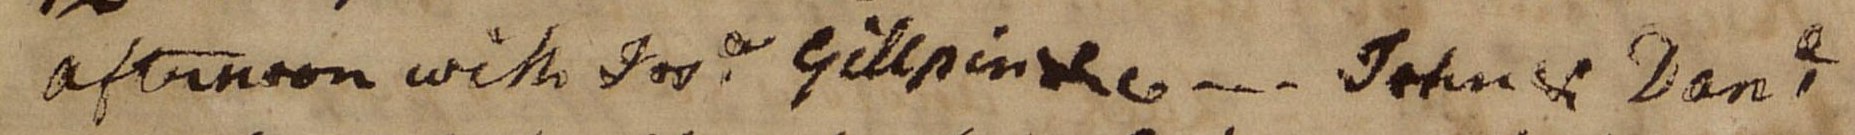afternoon with Jos^a. Gillpin &c- John & Dan^l.
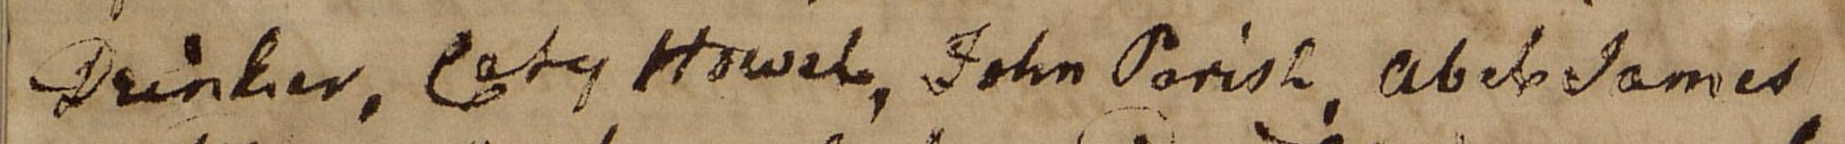Drinker, Cary Howel, John Parish, Abel James
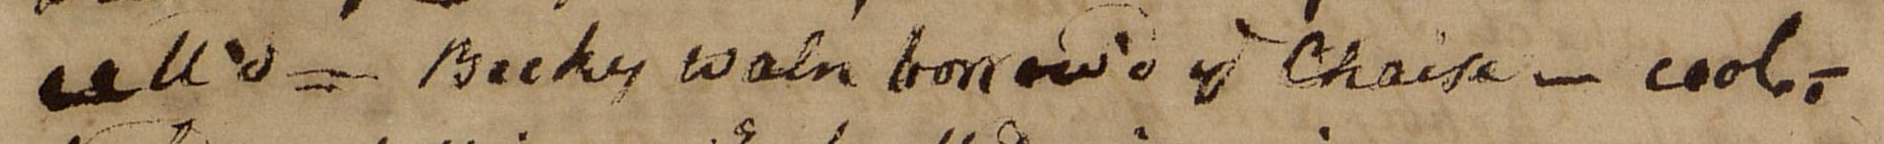call'd- Becky Waln borrow'd y^e Chaise- cool.-
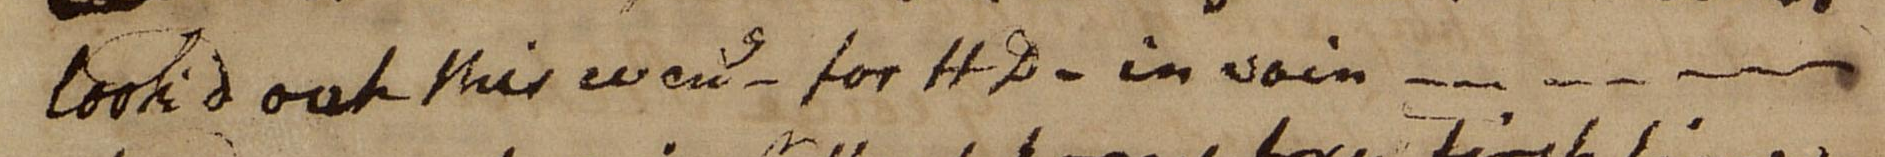look'd out this even^g.- for HD- in vain----
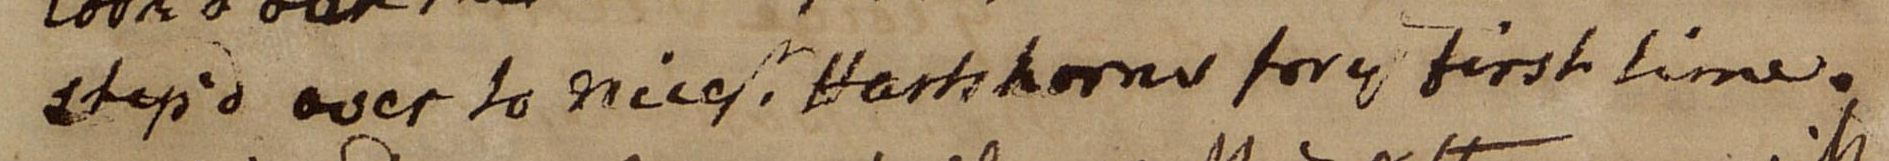stop'd over to Neig^r. Hartshorn for y^e first time.
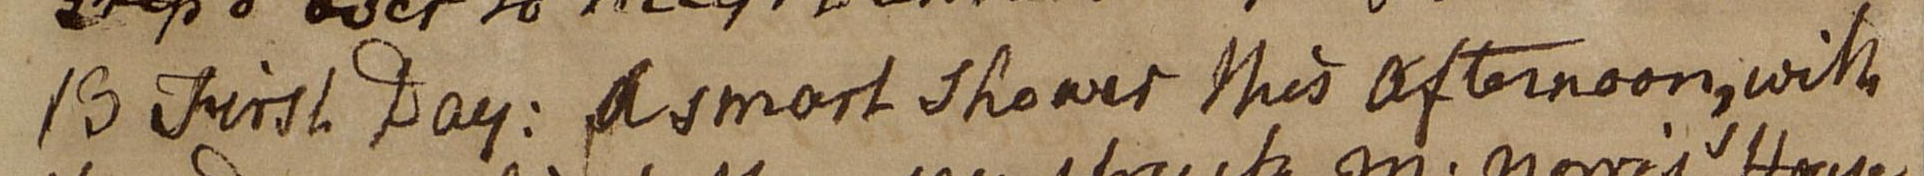13 First Day: a smart shower this Afternoon, with
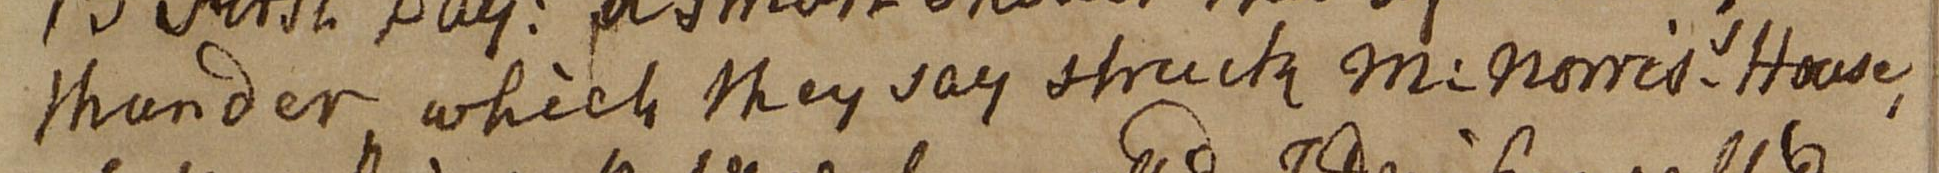thunder which they say struck M: Norris^s. House,
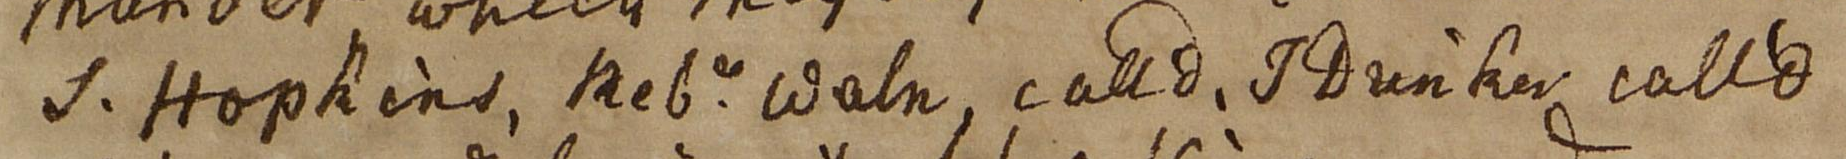S. Hopkins, Reb^a. Waln, call'd, I Drinker, call'd
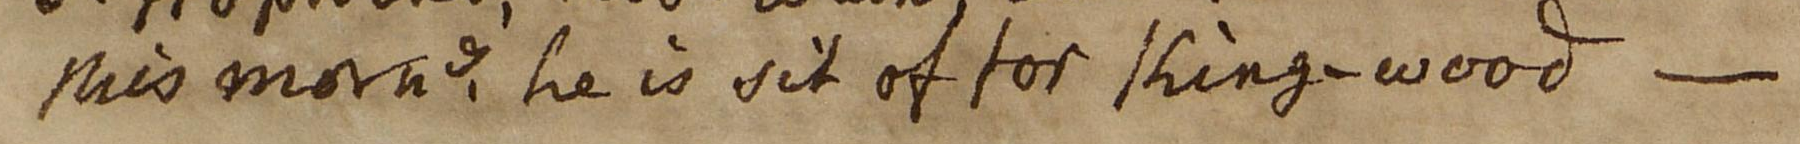this morn^g. he is sit of for King-wood-
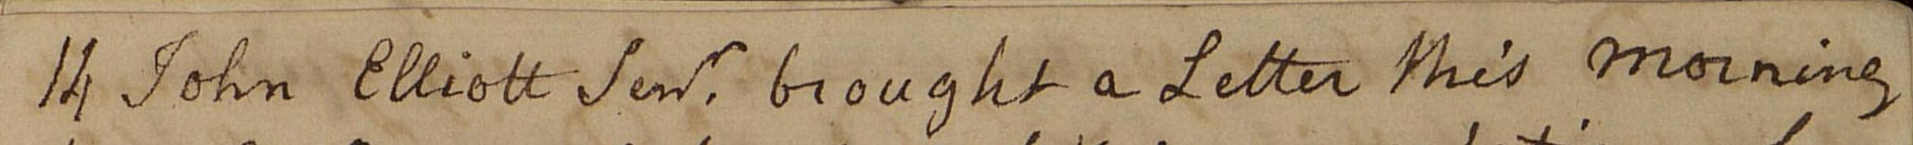14 John Elliott Sen^r. brought a Letter this morning
